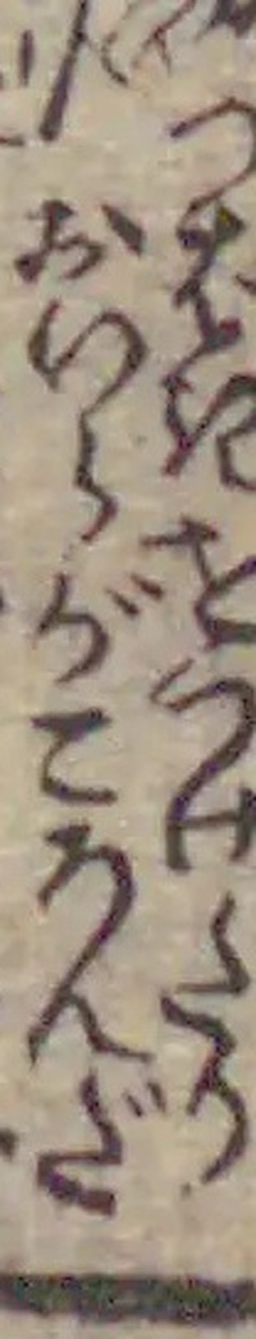おいらがころんだ
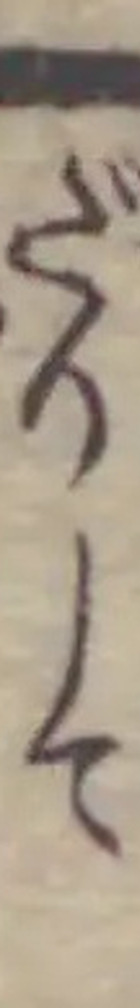だりして
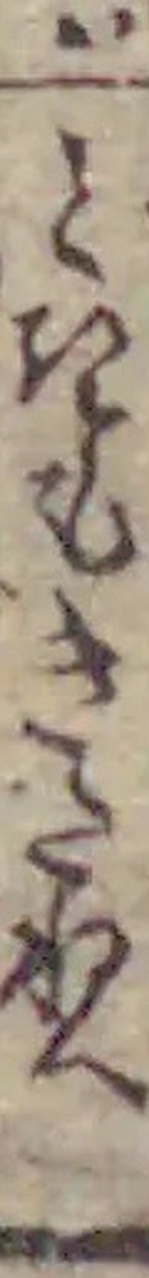ときもきたねへ
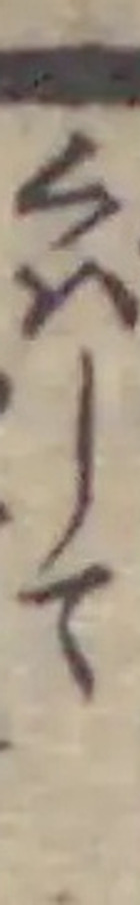くはして
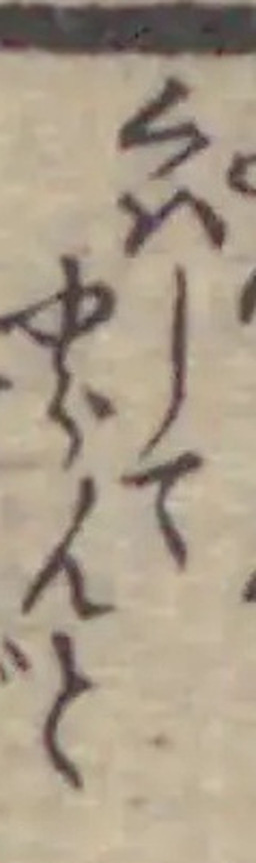やらんと
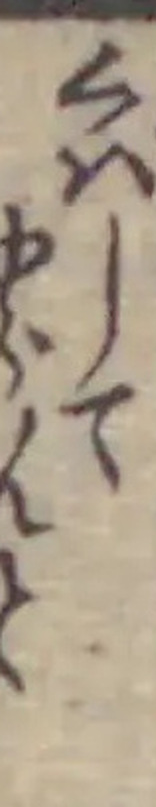くはして
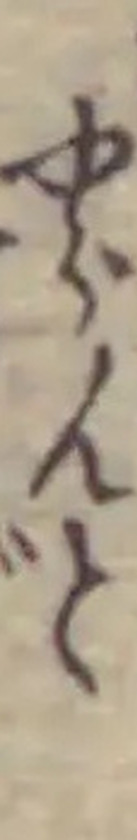やらんと
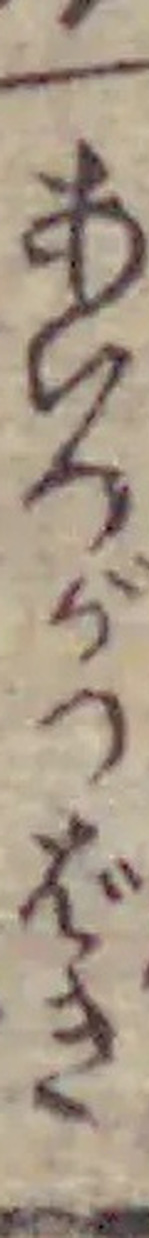あいつがつばき
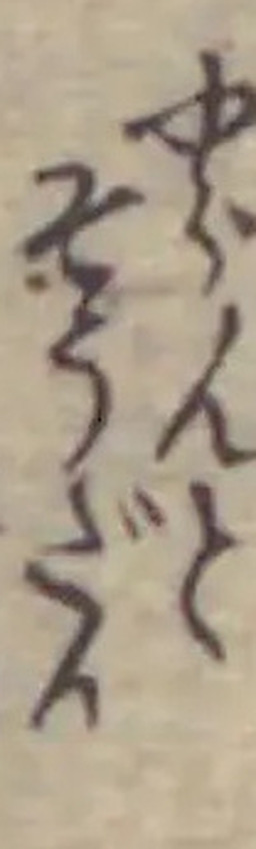そうだん
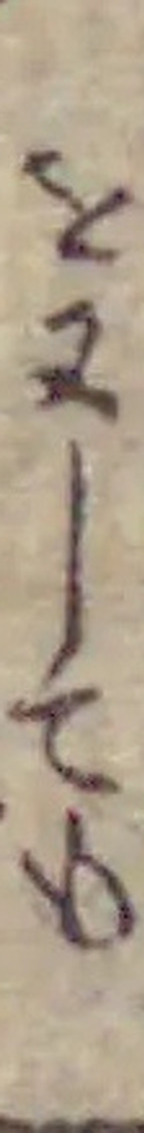を又しても
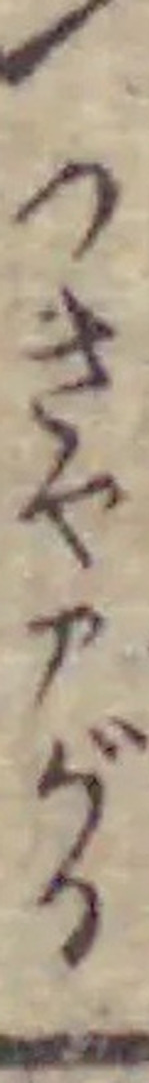つきやぁがる
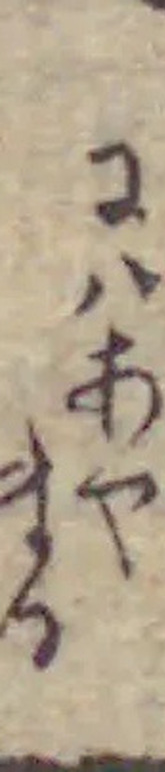にはあや
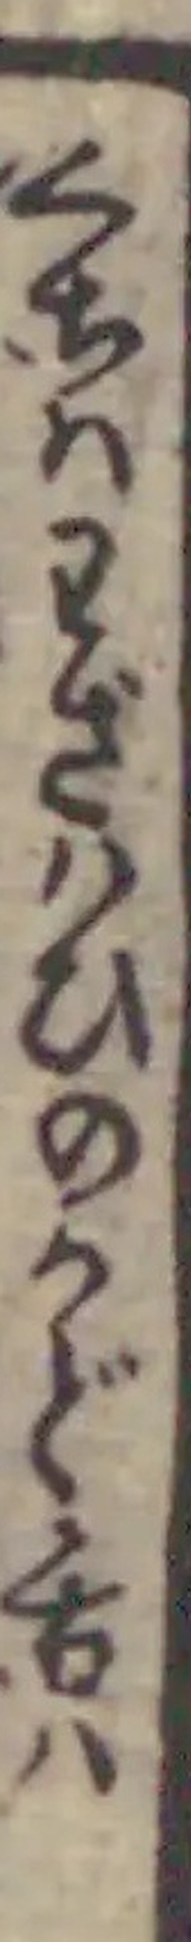くちはわざはひのかど舌は
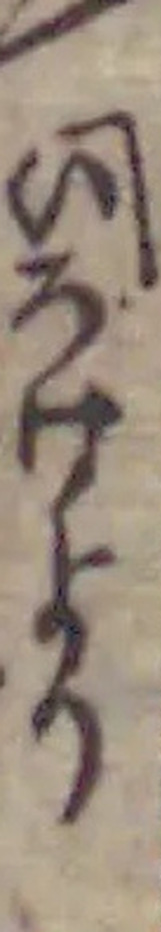〽いろけより
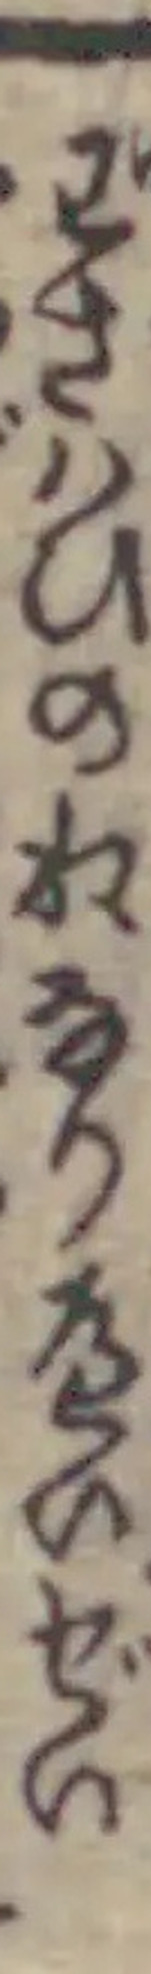わざはひのねなりへいぜい
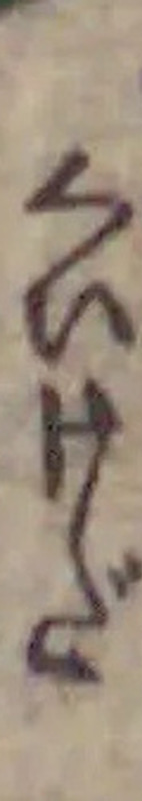くいけだ
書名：腹内養生主論 3巻
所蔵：国立国会図書館 National Diet Library, JAPAN
